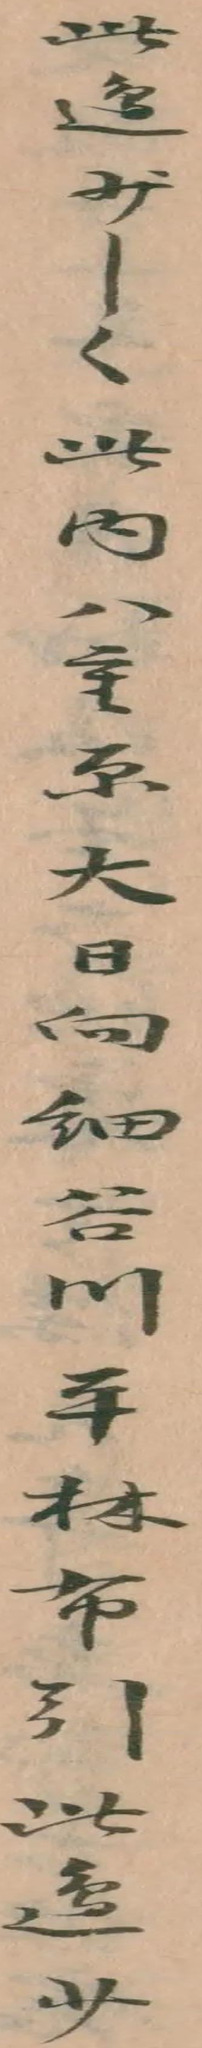此辺少しく此内八重原大日向細谷川平林布引此辺少
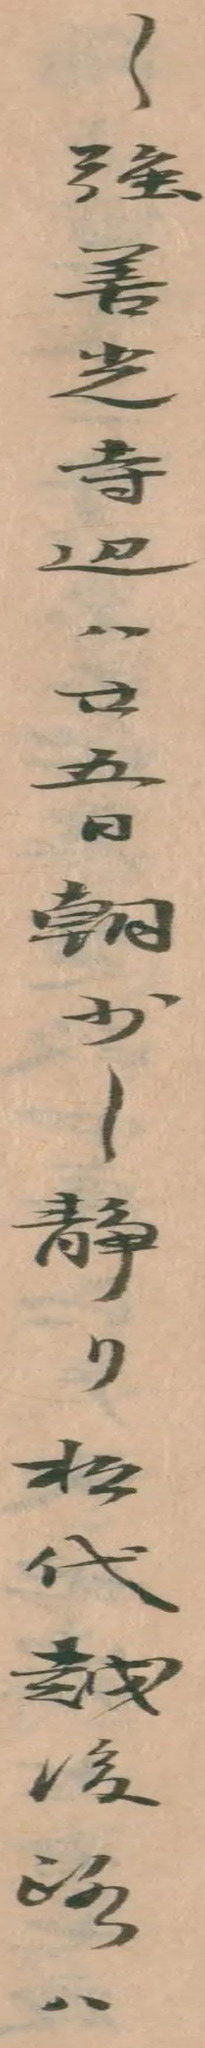し強善光寺辺ハ廿五日朝少し静り松代越後路ハ
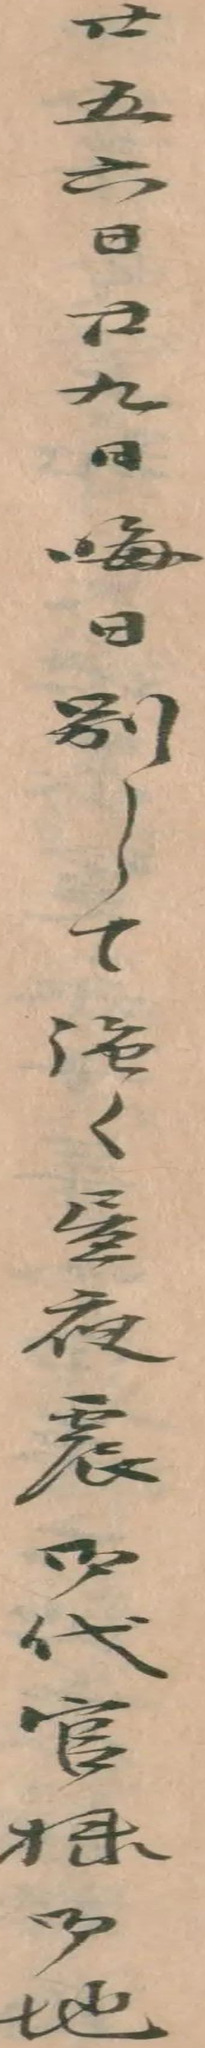廿五六廿九日晦日別して強く昼夜震御代官様御地
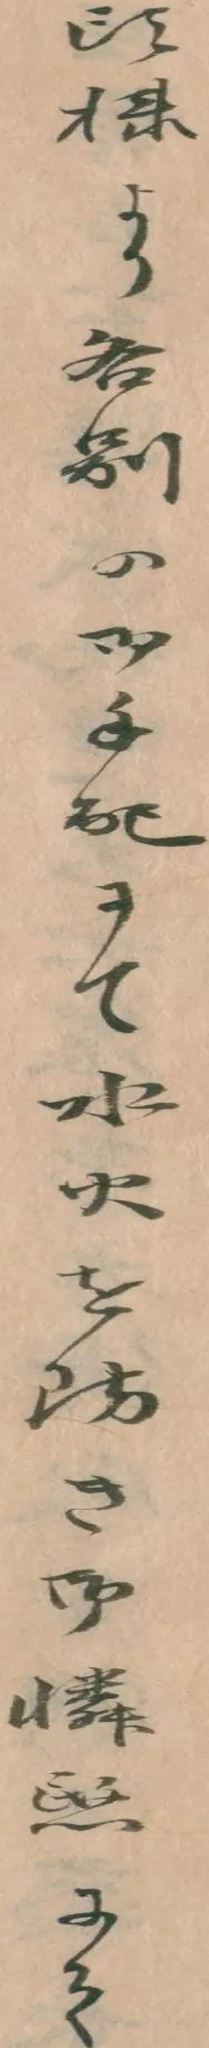頭より格別の御手配にて水火を防き御憐愍にて
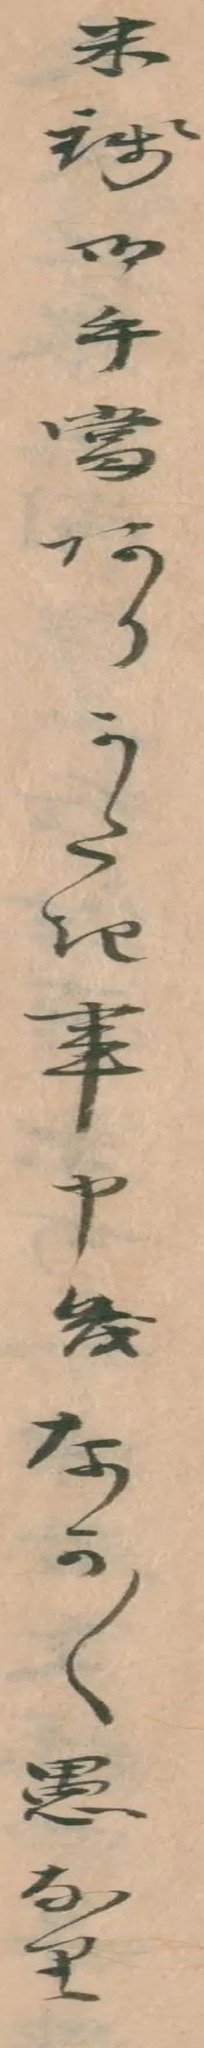米銭御手当ありかたき事申も中々愚なり

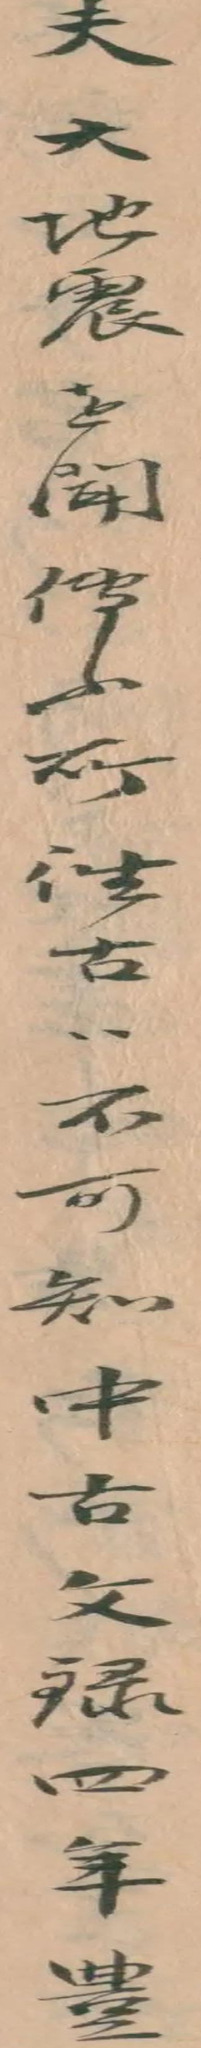夫大地震を聞伝ふ所往古ハ不可知中古文禄四年豊臣秀
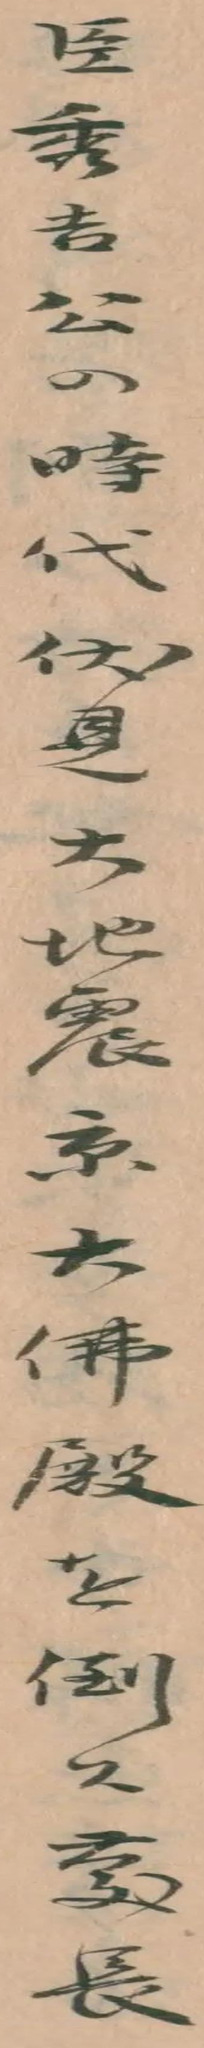吉公の時代伏見大地震京大仏殿を倒す慶長
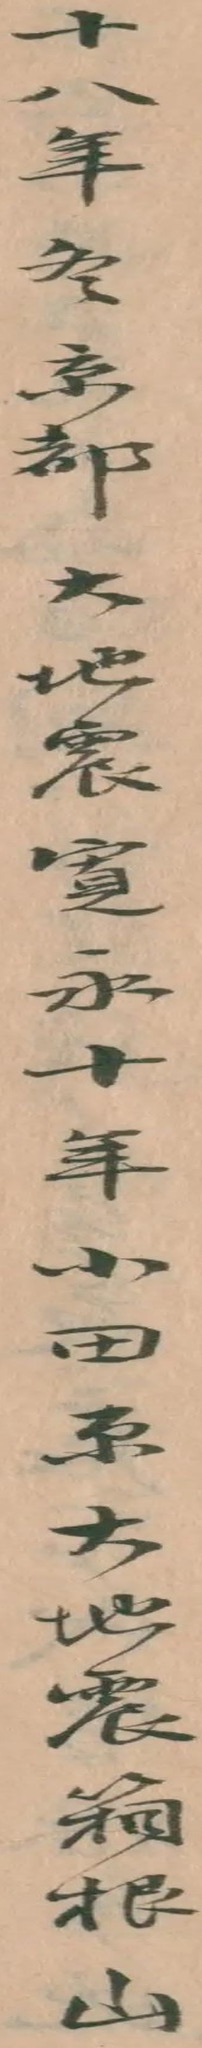十八年冬京都大地震寛永十年小田原大地震箱根山
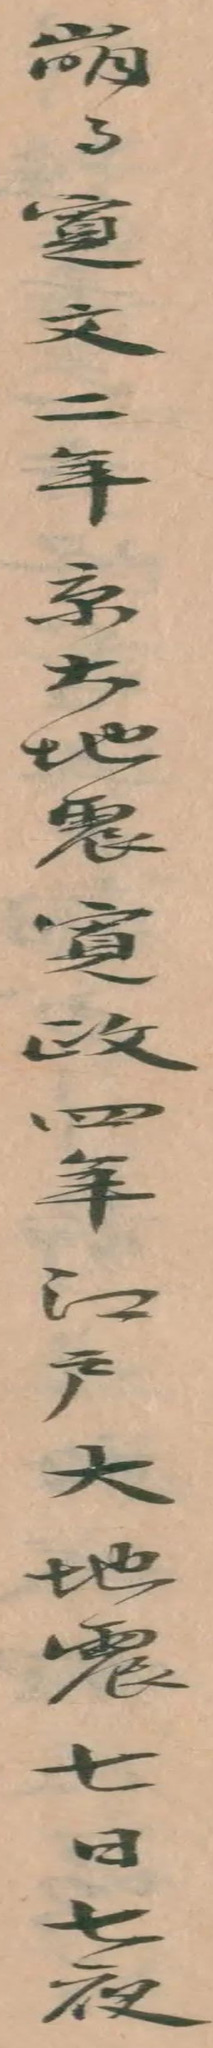崩る寛文二年京大地震寛政四年江戸大地震七日七夜
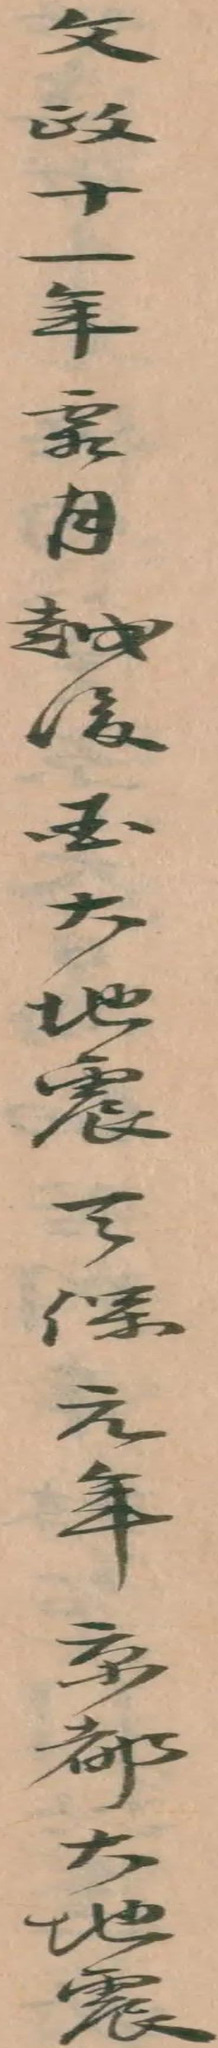文政十一年霜月越後国大地震天保元年京都大地震
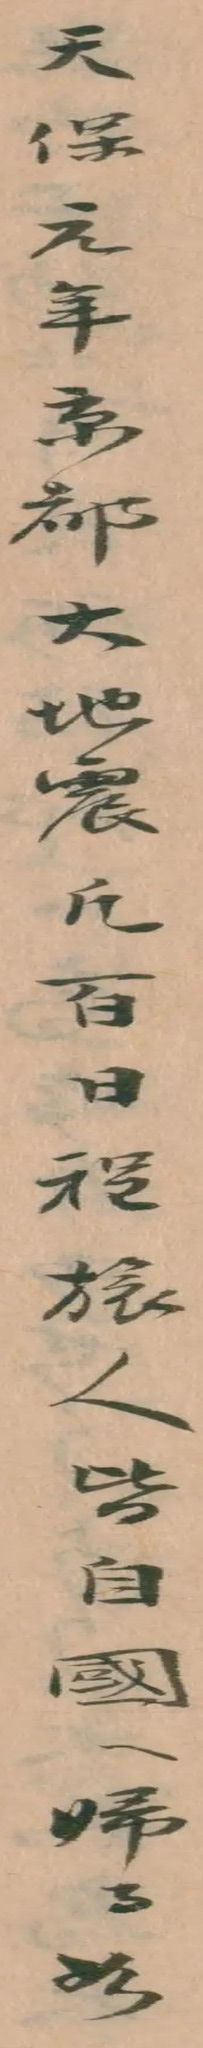天保元年京都大地震凡百日程旅人皆自国へ帰る如
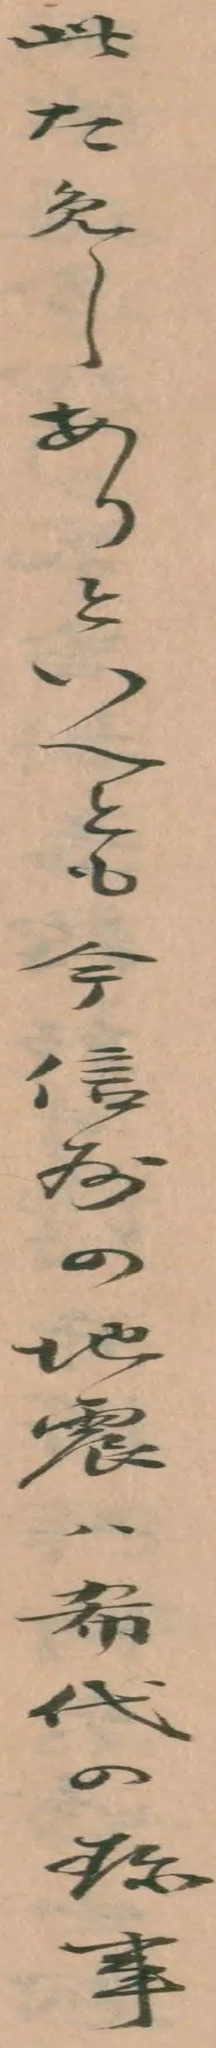此ためしありともいへとも今信州の地震ハ希代の珍事
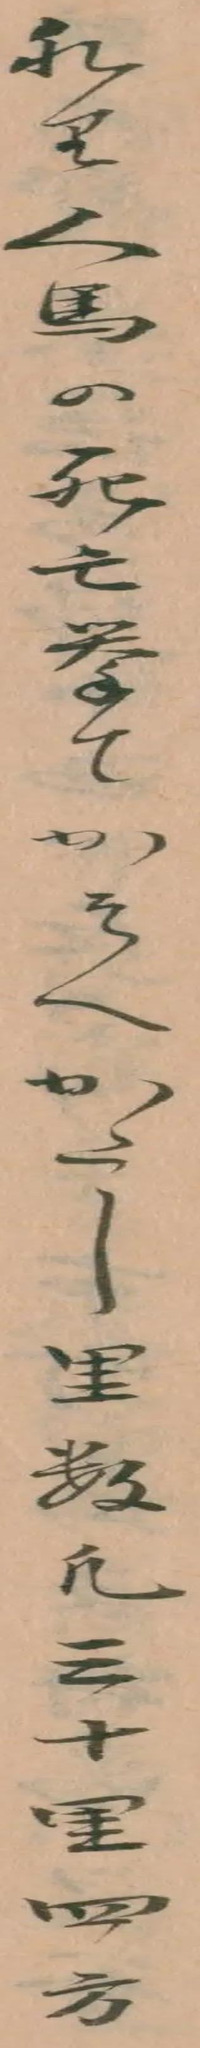なり人馬の死亡挙げてかそへかたし理数凡三十里四方
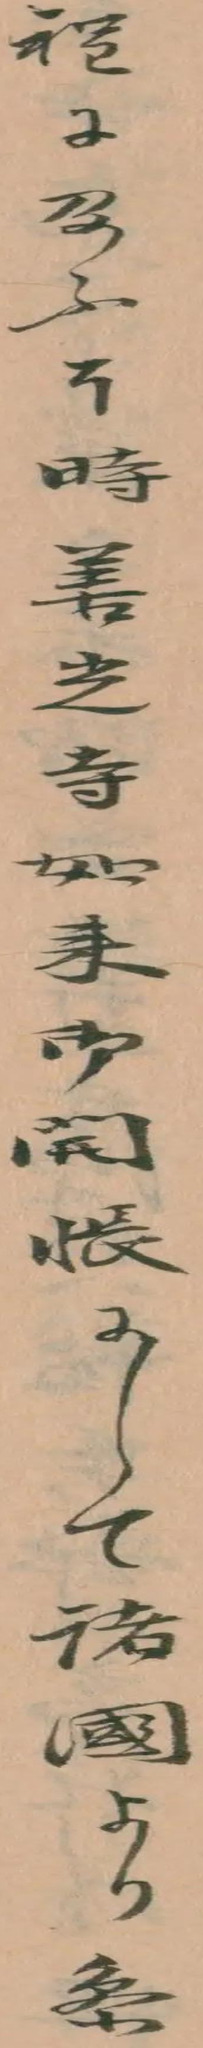程に及ふ干時善光寺如来御開帳にて諸国より参
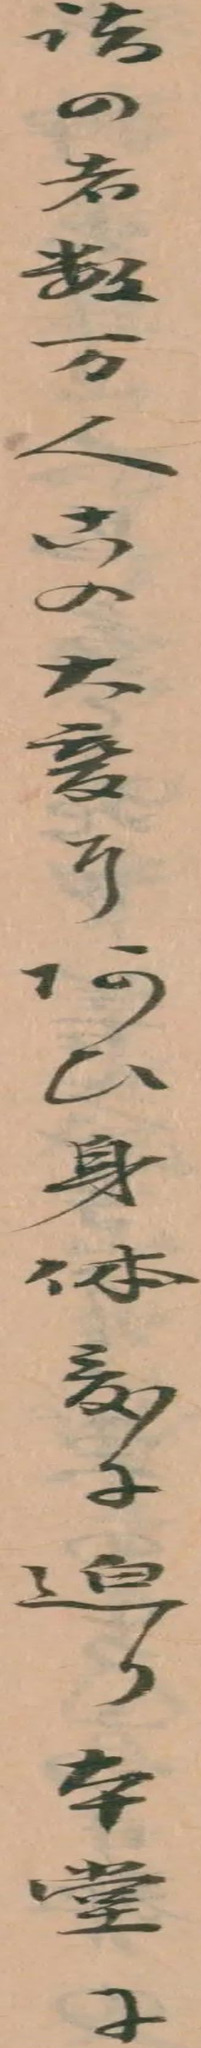詣の者数万人この大変にあひ身体茲に迫り本堂
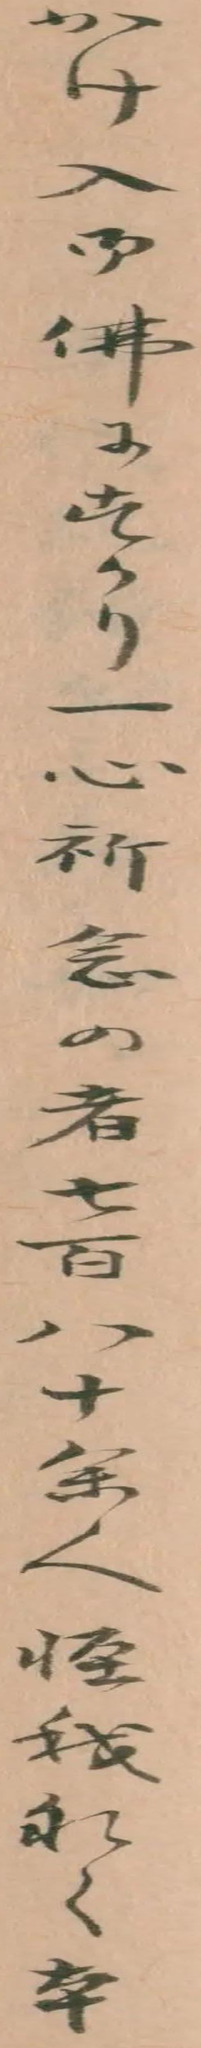にかけ入御仏にすかり一心祈念の者七百八十人怪我なく本
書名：地災撮要. 巻3(地震之部)-巻4(噴火之部)
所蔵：国立国会図書館 National Diet Library, JAPAN
